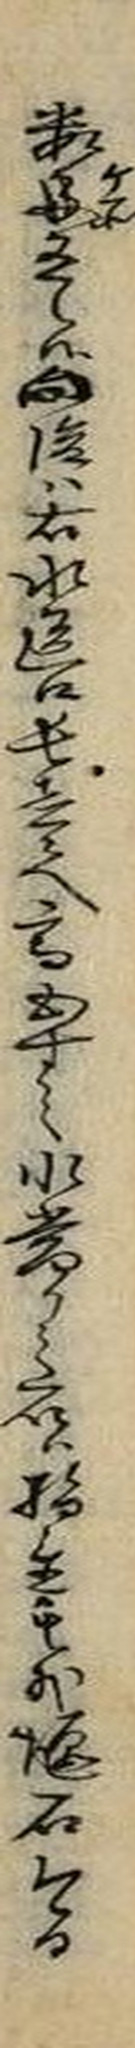数ケ所有之候向後は右水道口長壱尺高五寸之水当り之石は指置其外堰石今日
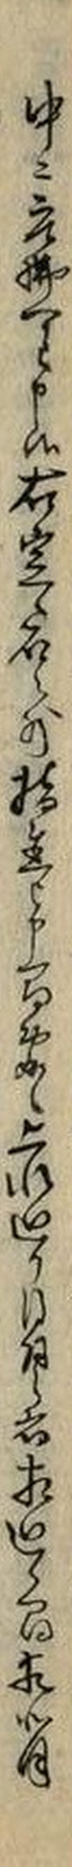中に取払可被申候右定候石之外指置被申間敷候上水廻り目付之者相廻候間相背
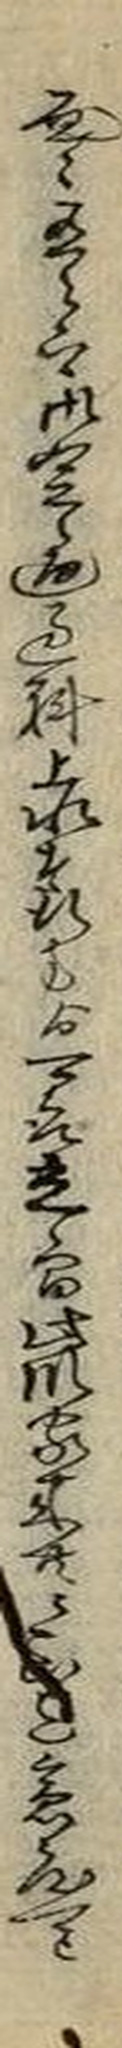面々有之候はゝ御定之通過料上水奉行方ゟ可取立候間此段家来共に至迄急度可被
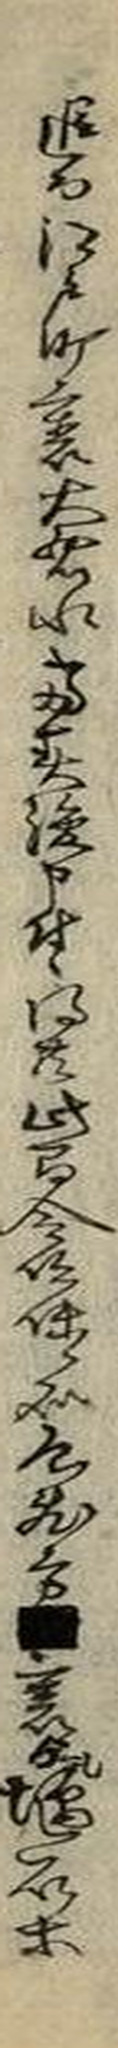追て江戸町裏大悪水当春浚申付候得共此間令吟味候処屋敷方裏ゟも堰石等
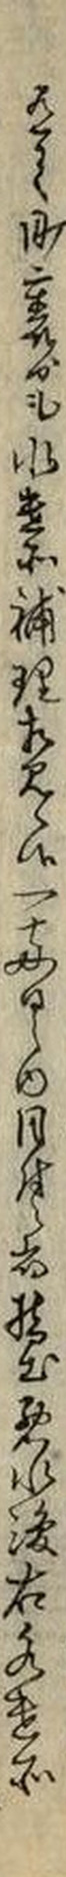有之町裏ゟも水遣所補理相見へ候一両日之内目付之者指出悪水浚右水遣所
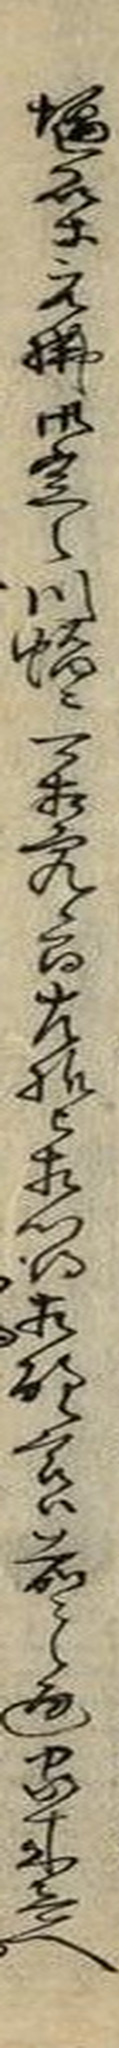堰石等取払御定之川幅に可相究候間左様被相心得相触候節は前々之通家来壱人
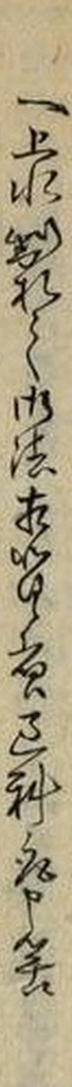一上水制札之御法相背候者は過料取申筈
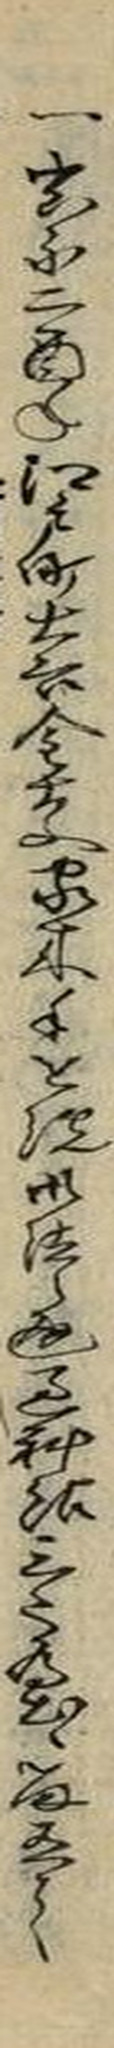一宝永二酉年江戸町大谷金大夫家来手を洗御法之通過料銀三匁為出候留有之
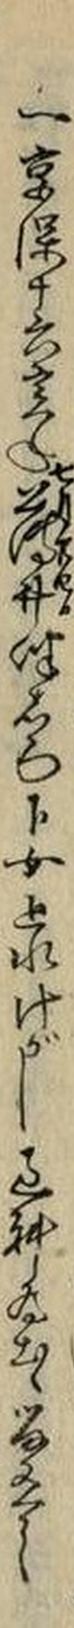一享保十六亥年七月廿四日薄井伴右衛門下女上水けがし過料為出候留有之
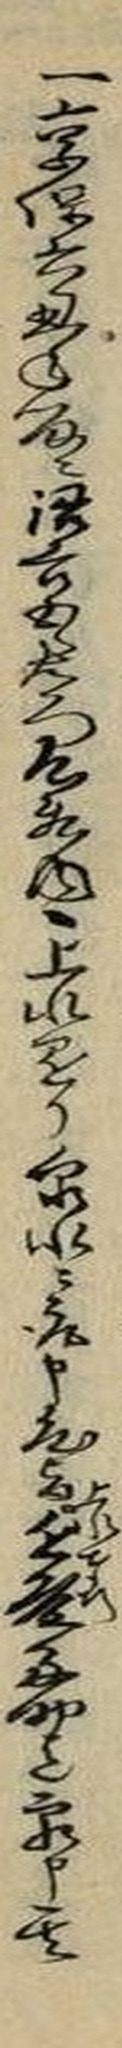一享保六丑年留に渋谷五郎左衛門屋敷内へ上水懸り泉水に取申度旨上水奉行近藤多助迄願申其
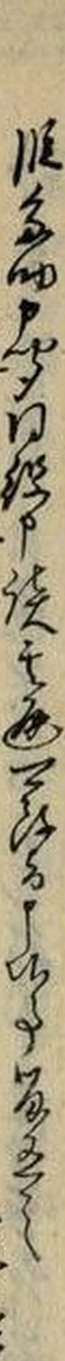段多助申聞同役申談其通可致旨申候事留有之
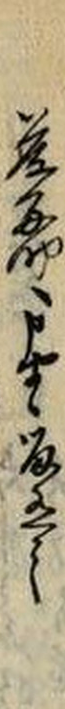藤多助へ申聞候留有之
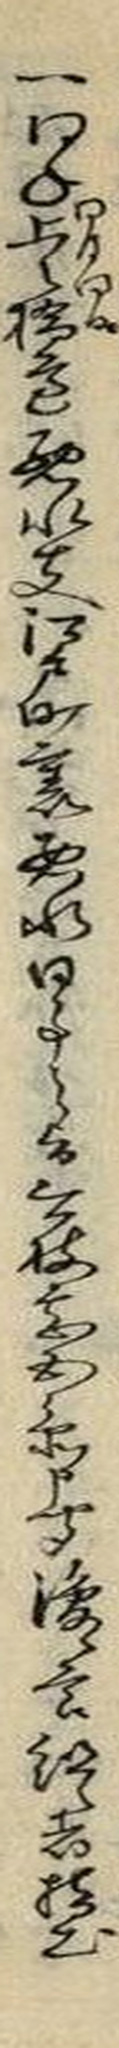一同年同月同日上之橋辺悪水支江戸町裏悪水同事之旨今枝甚五兵衛申聞浚候節組之者指出
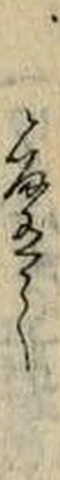候留有之
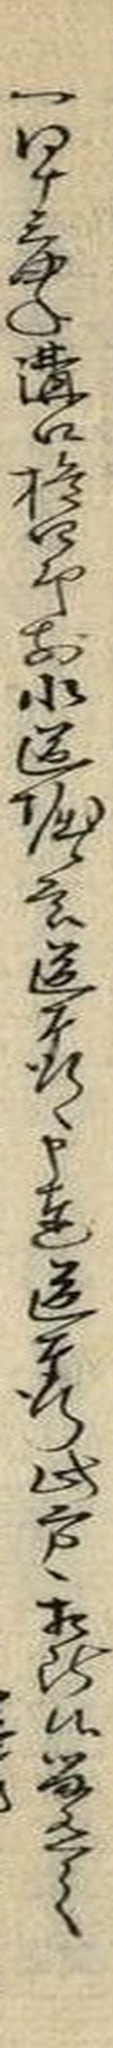一同十三申年溝口権四郎前水道堀候節道奉行へ申達道奉行此方へ相断候留有之
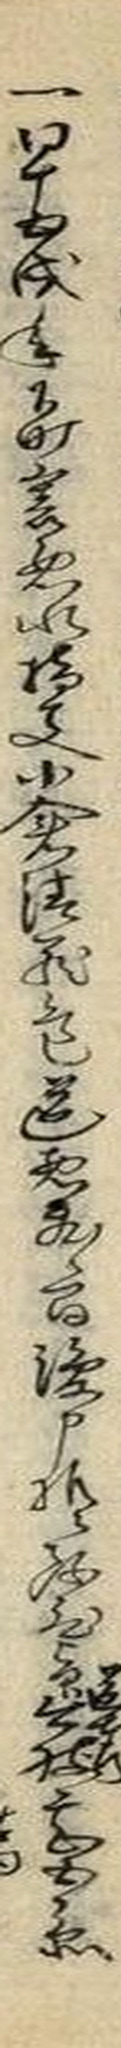一同十五戌年下町裏悪水指支小倉清蔵辺道悪敷候間浚申様に致度旨◦道奉行今枝甚五兵衛
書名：御城下諸事之部
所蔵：福井県文書館 Fukui Prefectural Archives
